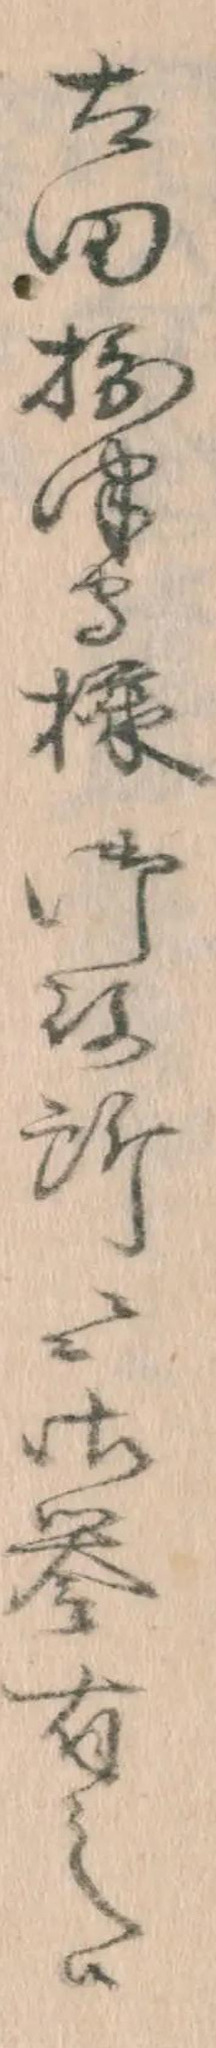太田摂津守様御役所ニ而御誉有之候
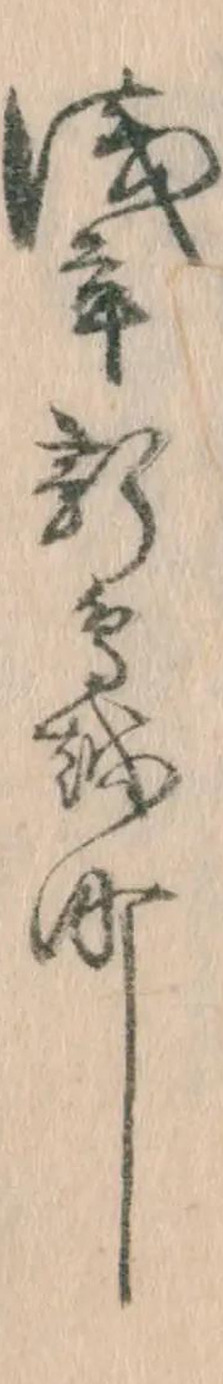浅草新鳥越町
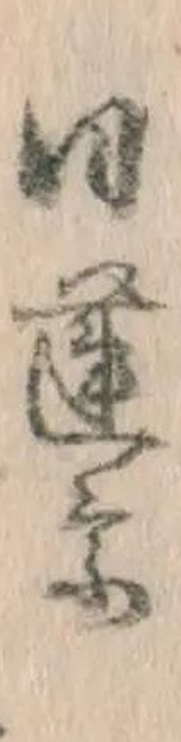日蓮宗
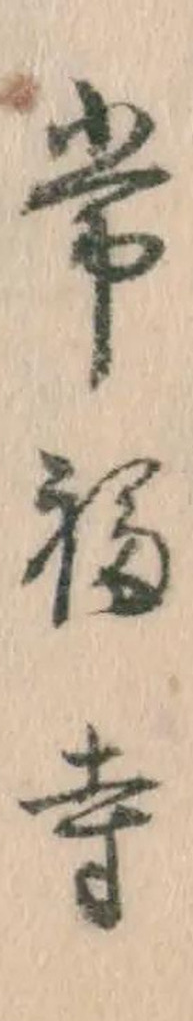常福寺
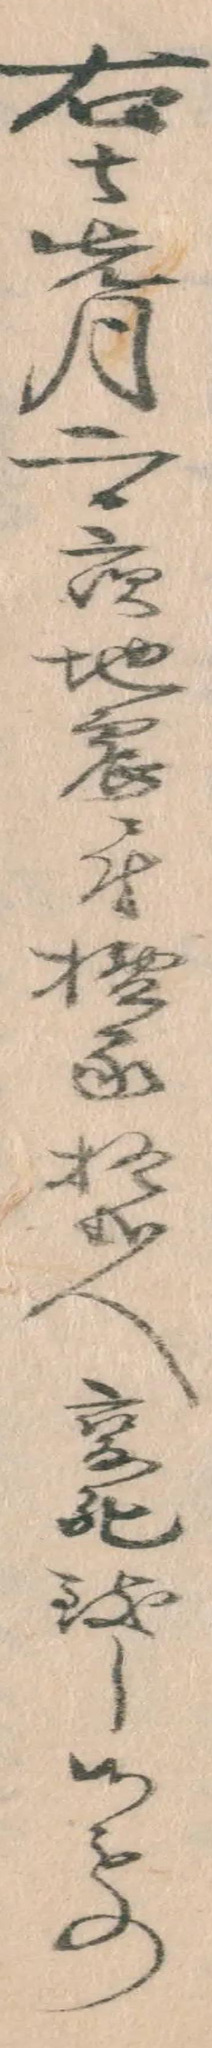右は先月二日夜地震ニ付檀家拾弐人変死致し候もの
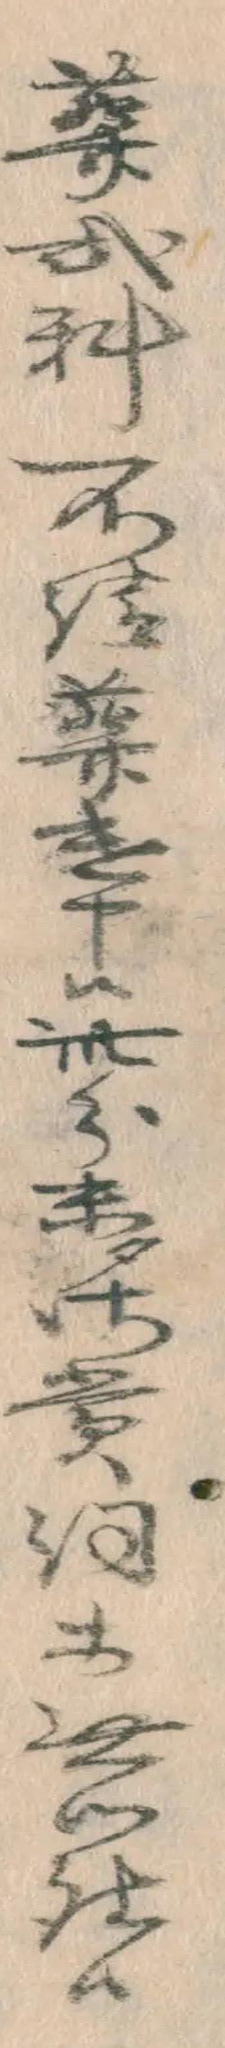葬式料不請葬遣申候此分未タ御賞伺等無御座候

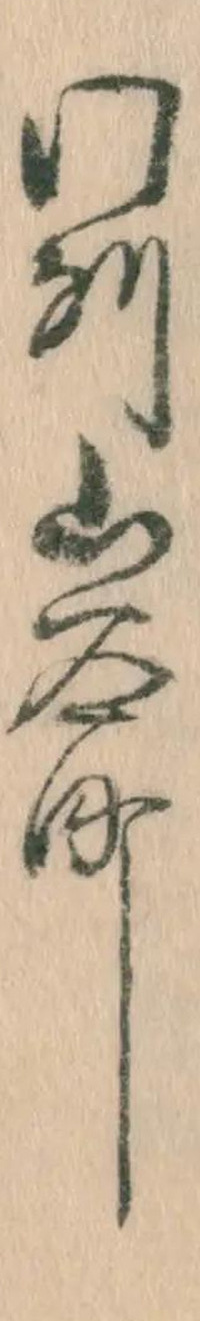同所山谷町
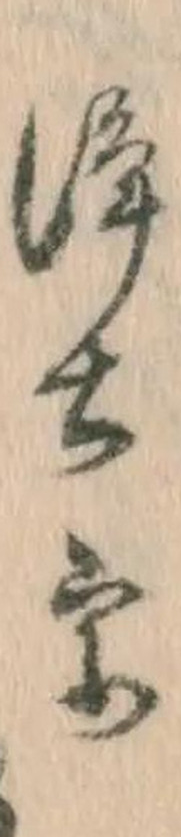浄土宗
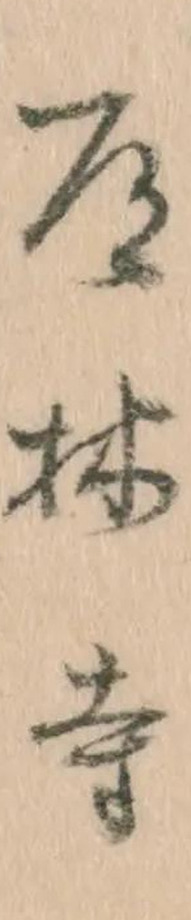道林寺
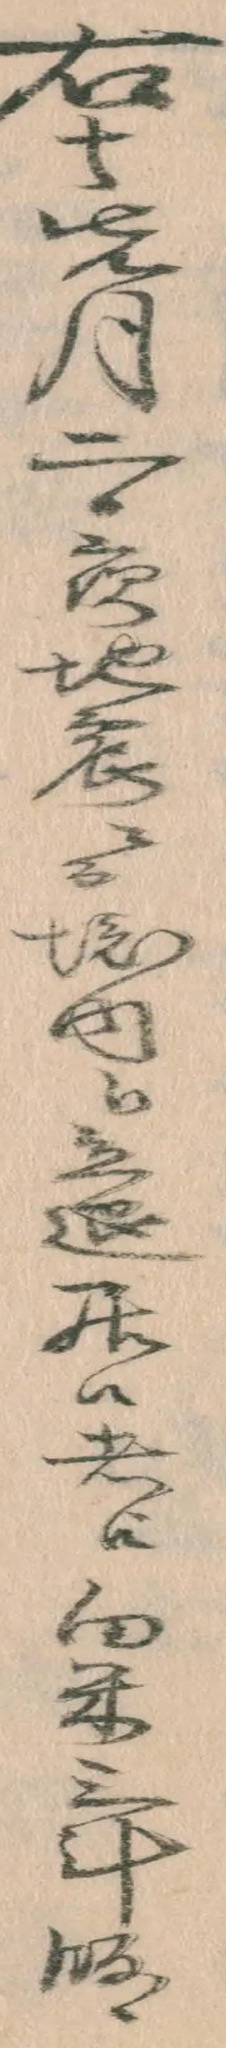右は先月二日夜地震ニ而境内え立退居候者え白米三斗飯ニ
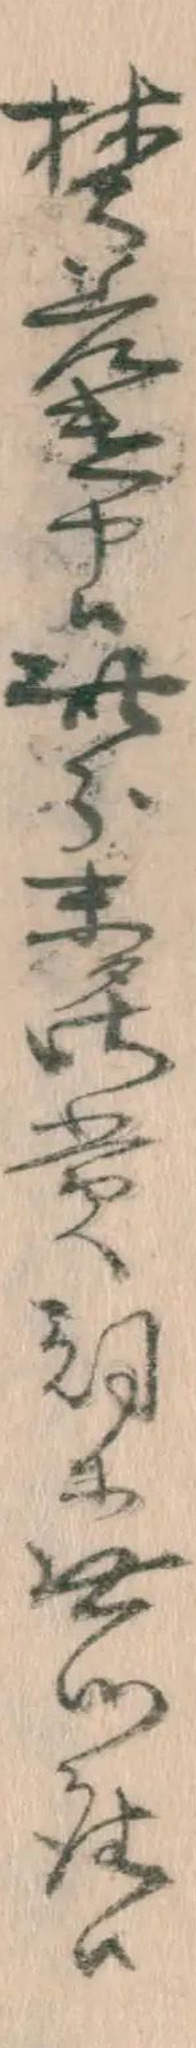焚差遣申候此分未タ御賞伺等無御座候
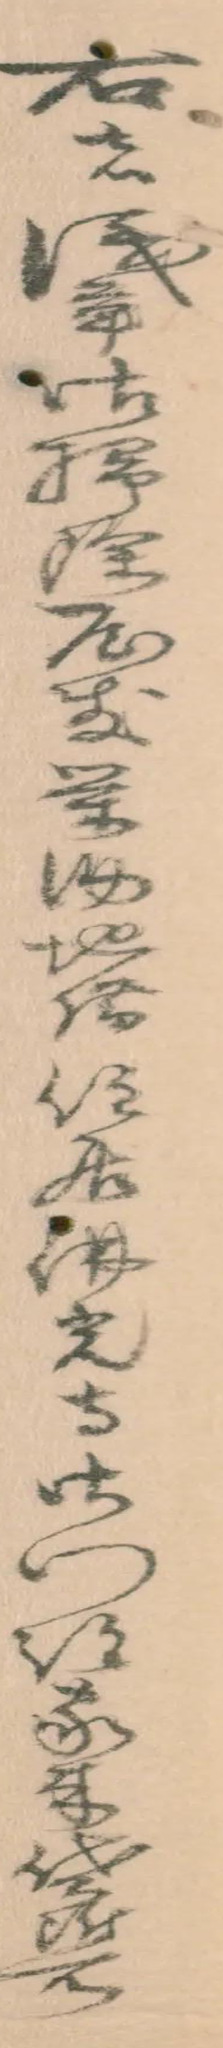右は浅草御掃除屋敷栄助地借住居仏光寺御門跡家来貸附所
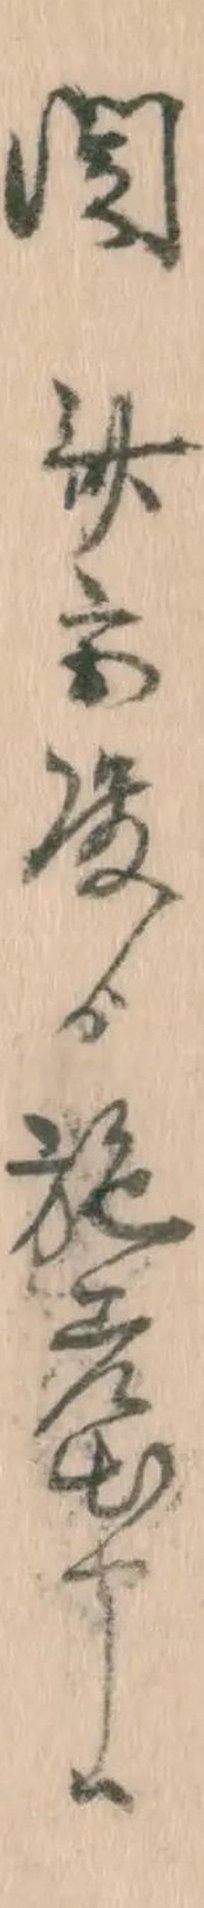関斎殿ゟ施差出申候
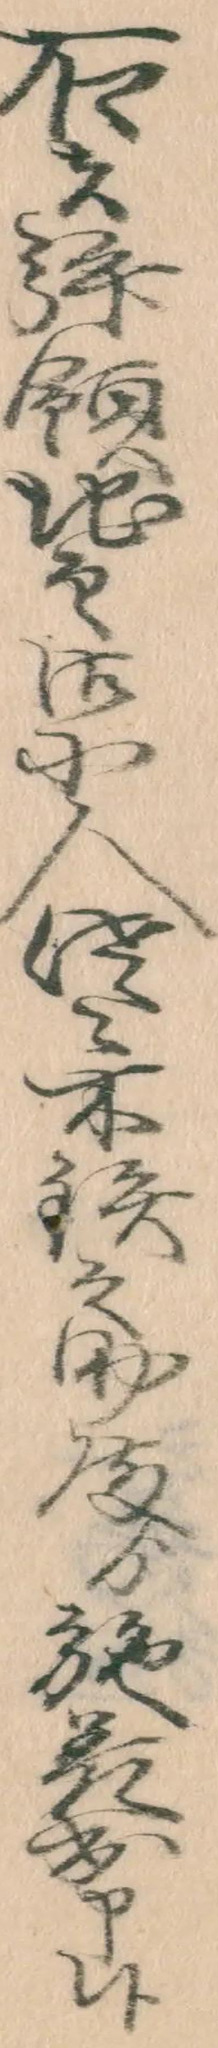右は拝領地主御小人佐々木鉄之助殿ゟ施差出申候

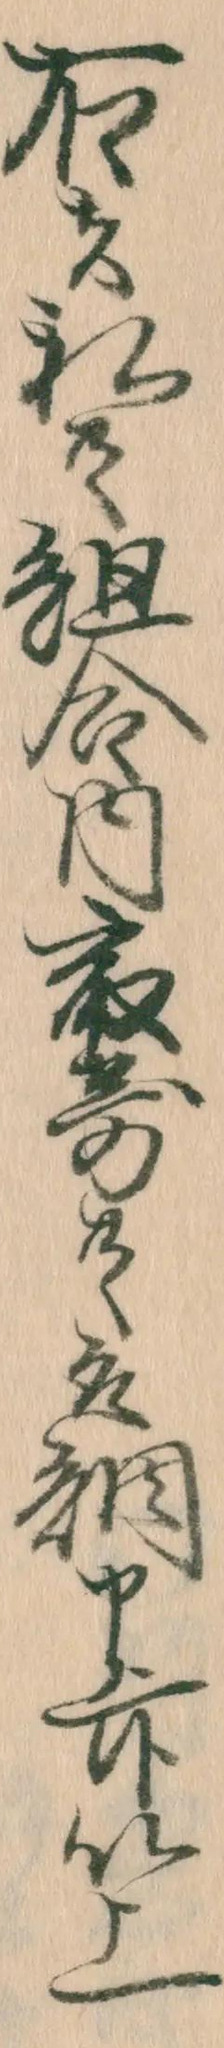右は私共組合内最寄共取調申上候以上
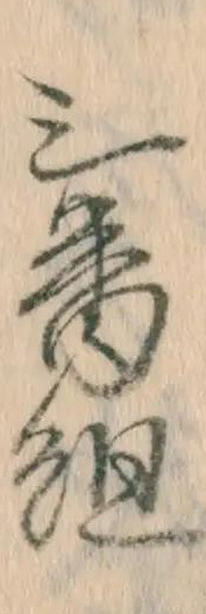三番組
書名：武家方并寺院等ニテ施差出候一件
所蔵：国立国会図書館 National Diet Library, JAPAN
